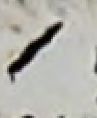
1
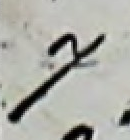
7
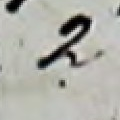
2
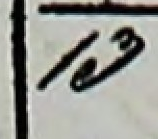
13
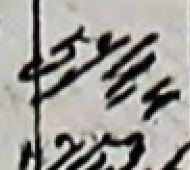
574,4
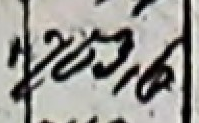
753,6
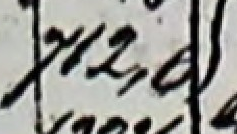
712,6
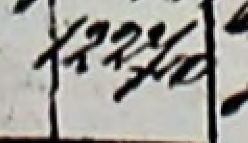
1227,0
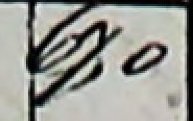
67,0
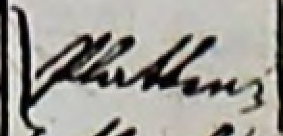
Platten„
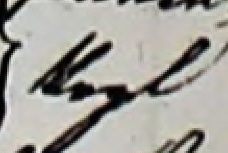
kogl
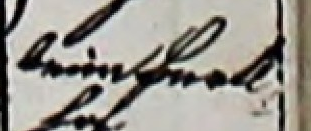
beim Bartl
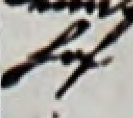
hof
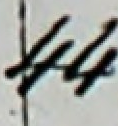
44
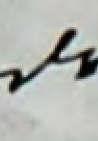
do
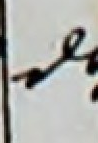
do
